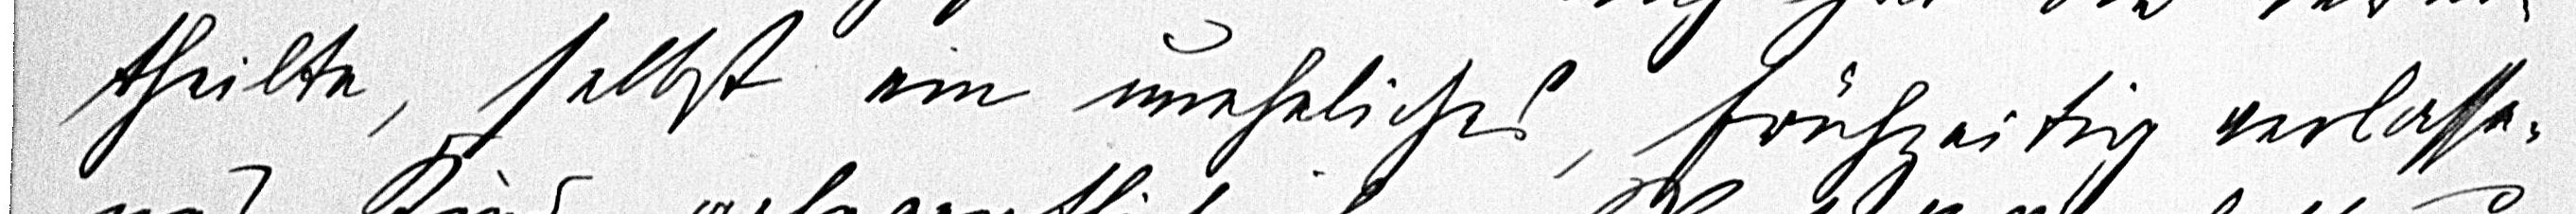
theilte, selbst ein uneheliches, frühzeitig verlasse¬
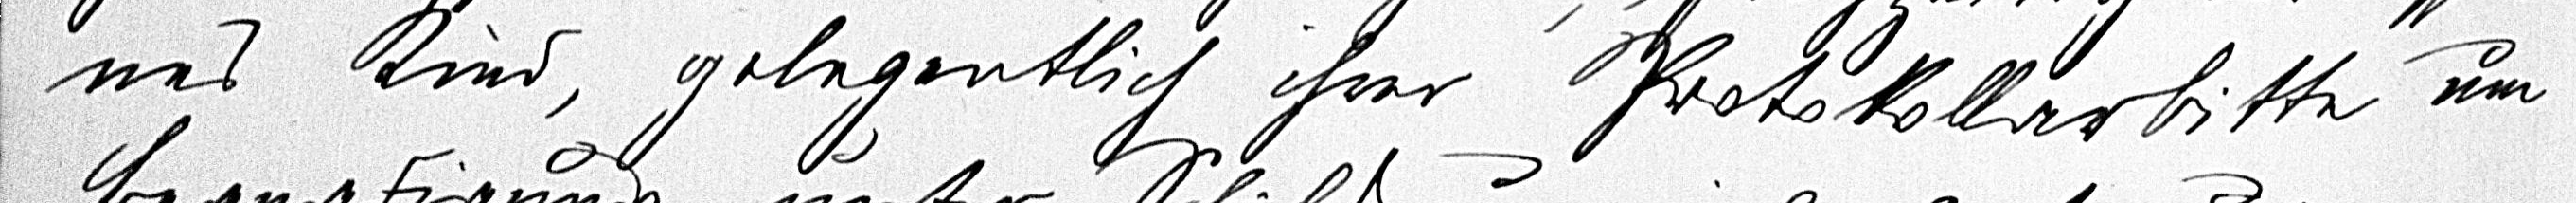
nes Kind, gelegentlich ihrer Protokollarbitte um
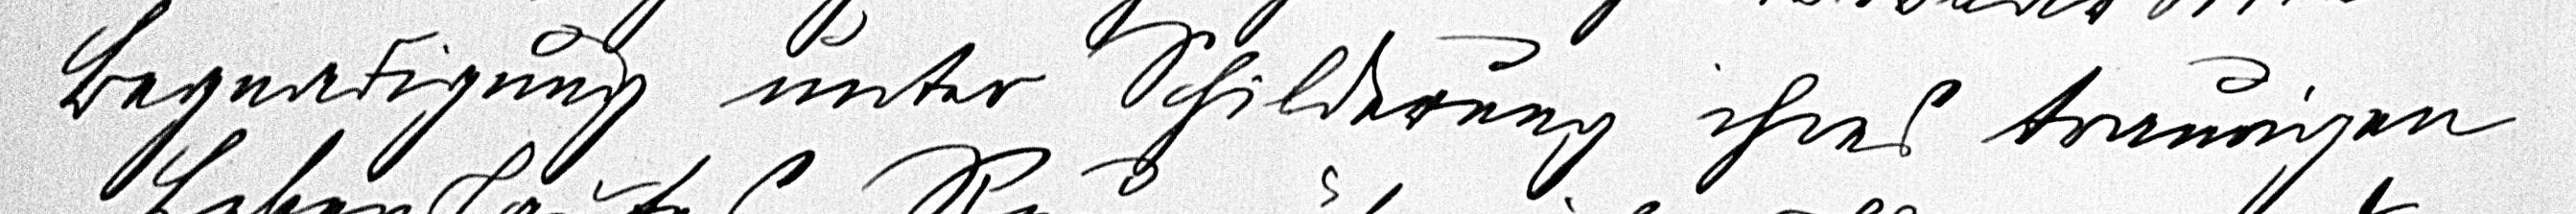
Begnadigung unter Schilderung ihres traurigen
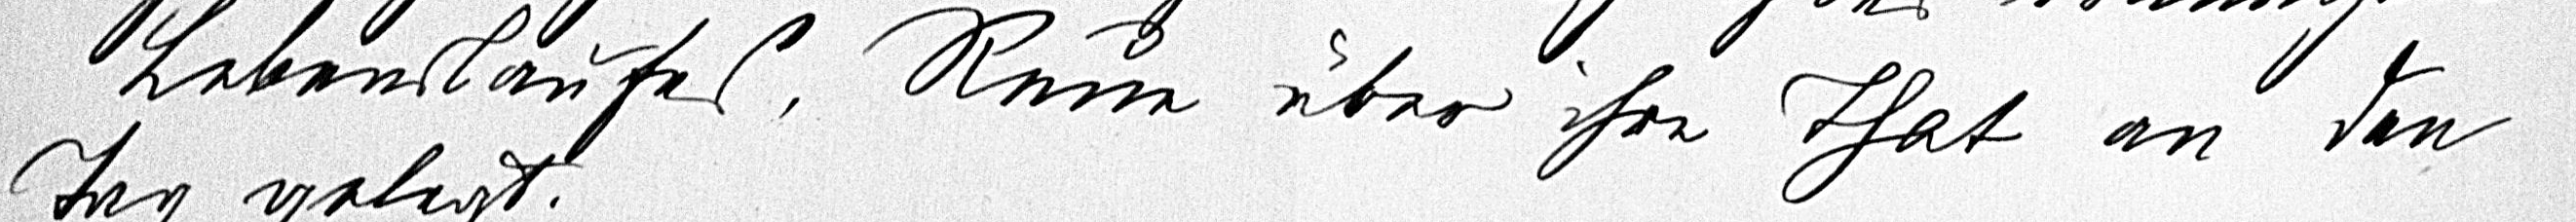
Lebenslaufes, Reue über ihre That an den
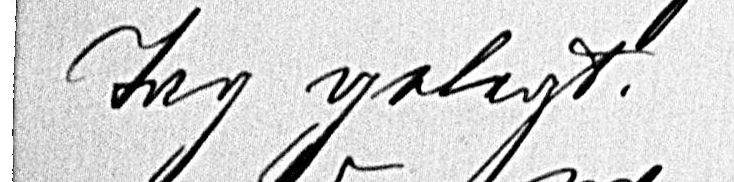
Tag gelegt.
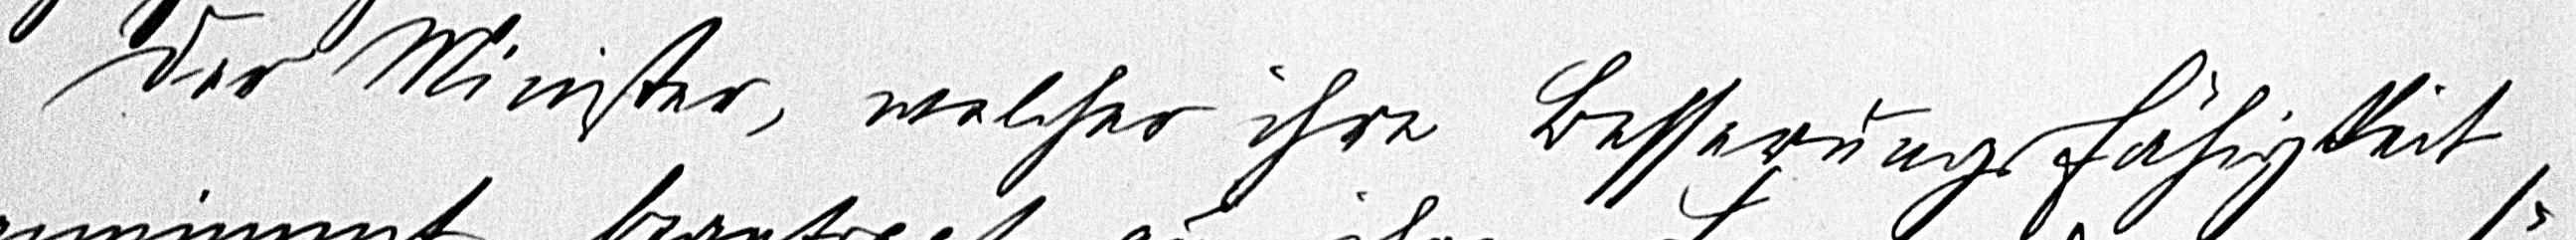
Der Minister, welcher ihre Besserungsfähigkeit
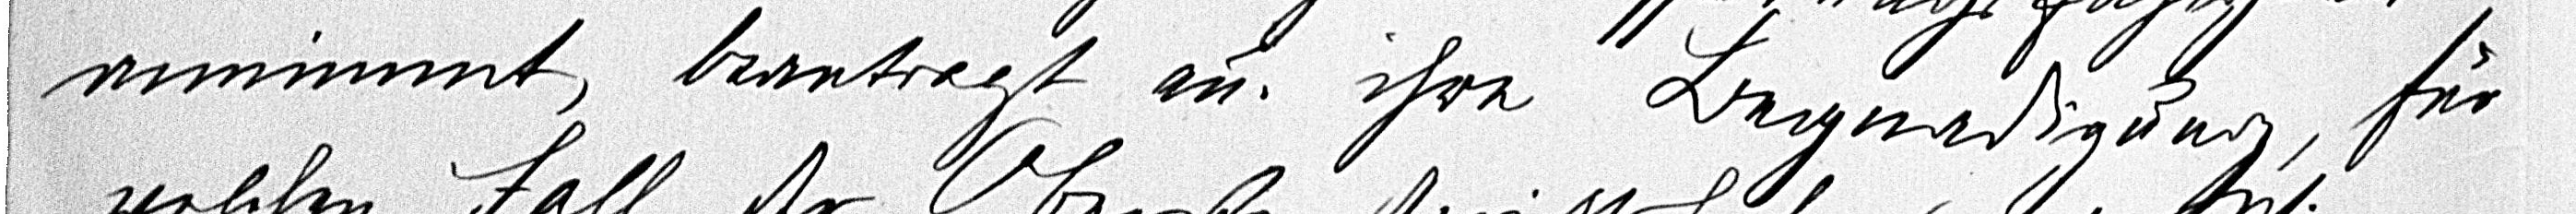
annimmt, beantragt xx ihre Begnadigung, für
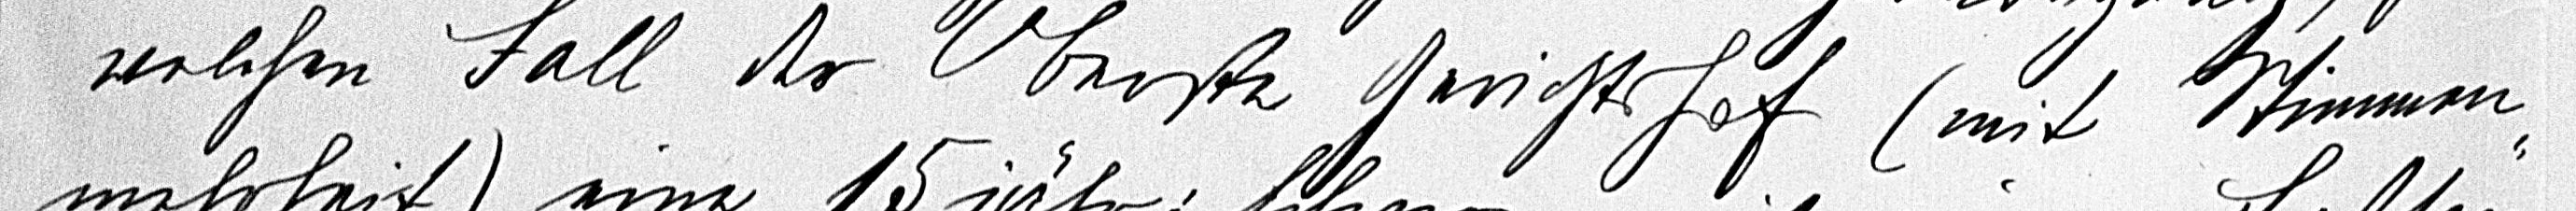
welchen Fall der Oberste Gerichtshof (mit Stimmen¬
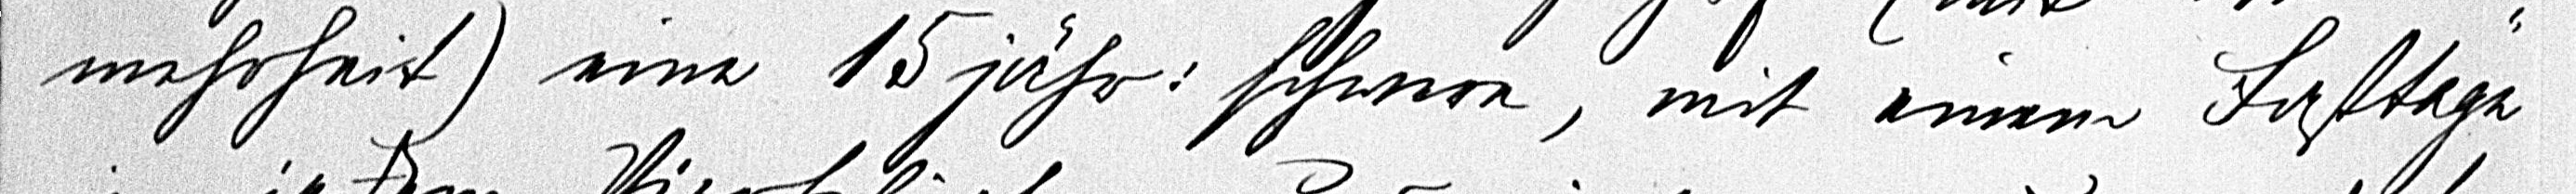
mehrheit) eine 15 jähr: schwere, mit einem Fasttage
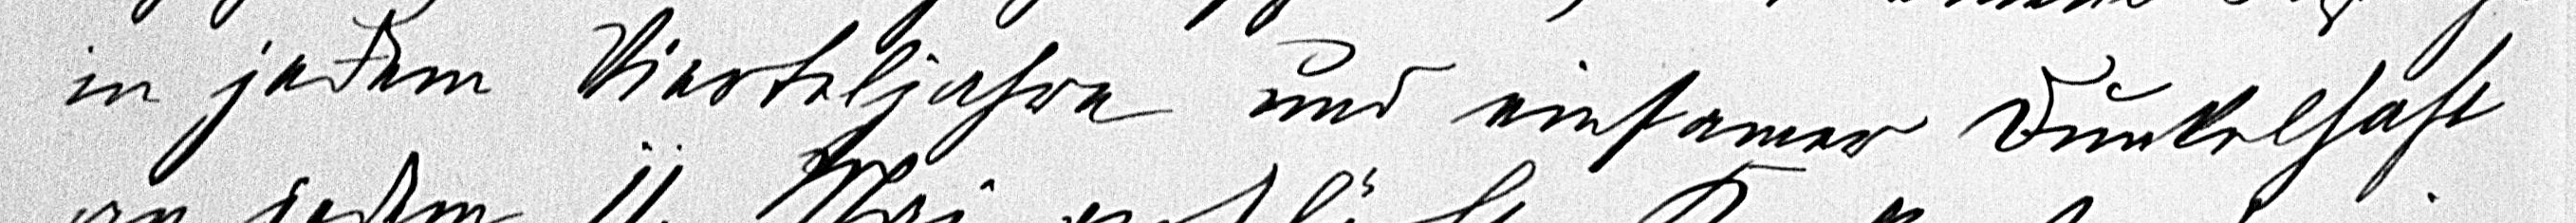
in jedem Vierteljahre und einsamer Dunkelhaft
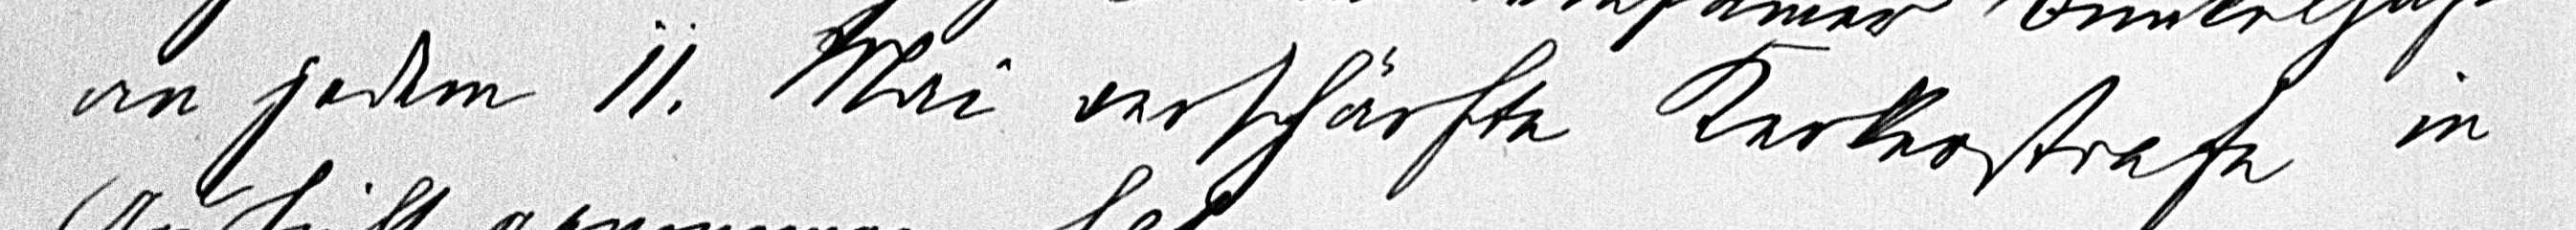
an jedem 11. Mai verschärfte Kerkerstrafe in
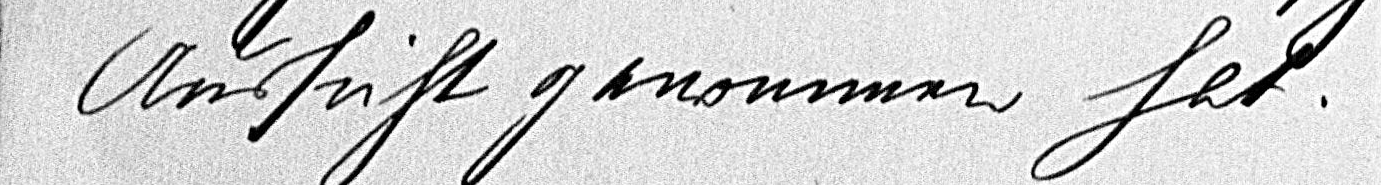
Aussicht genommen hat.
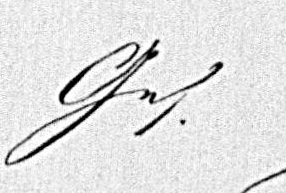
Ges.
